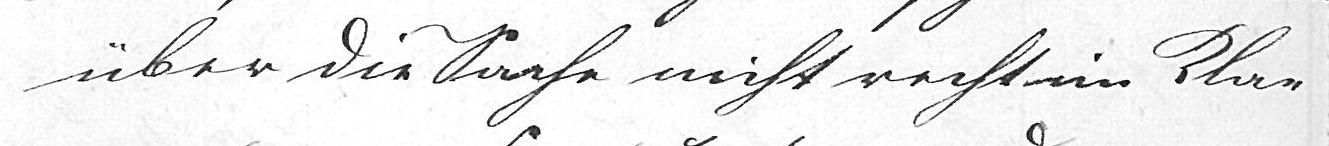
über die Sache nicht recht im Kla-
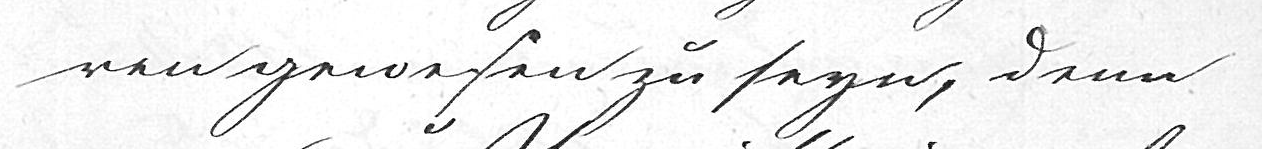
ren gewesen zu seyn, denn
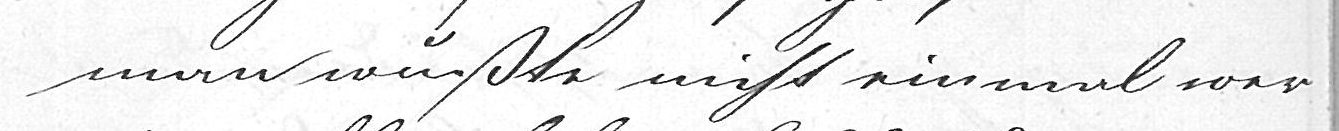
man wußte nicht einmal, wer
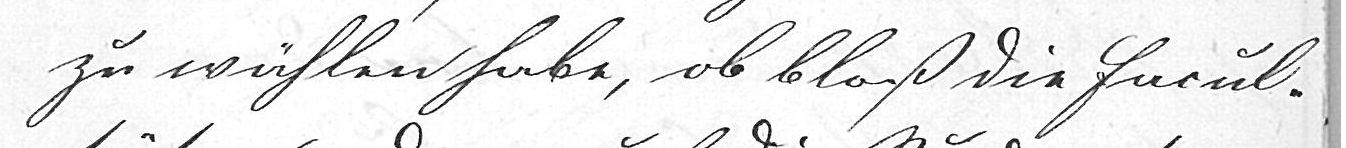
zu wählen habe, ob bloß die Facul-
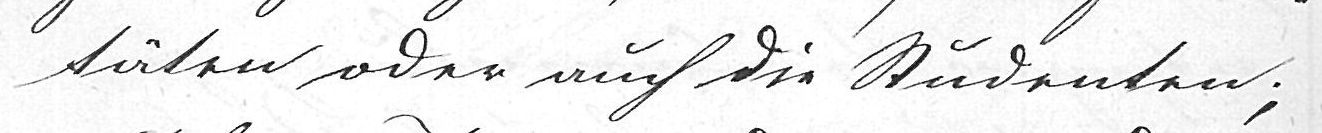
täten, oder auch die Studenten;
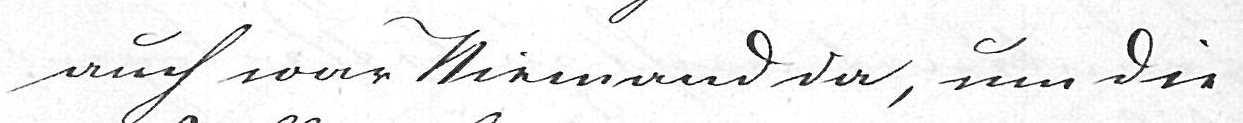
auch war Niemand da, um die
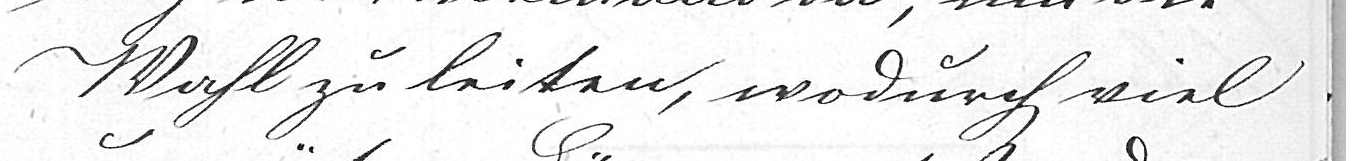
Wahl zu leiten, wodurch viel
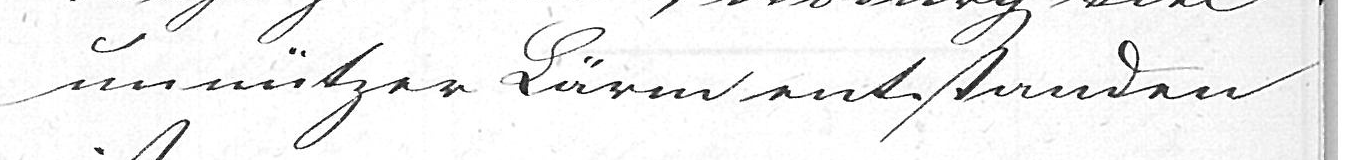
unnützer Lärm entstanden
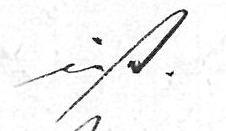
ist.
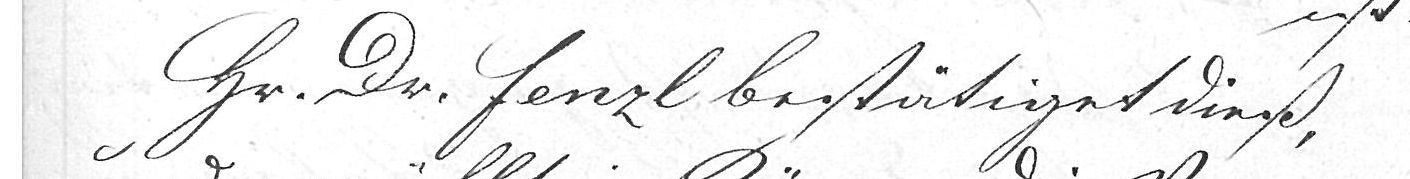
Hr. Dr. Fenzl bestätiget dieß,
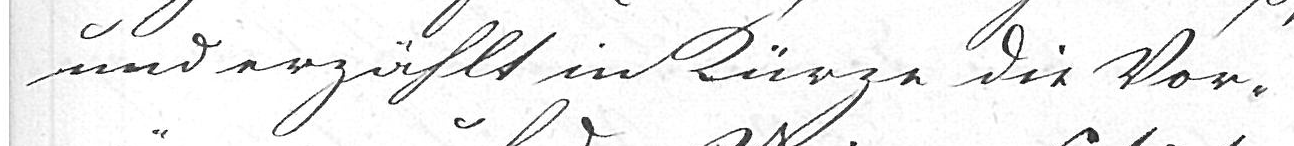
und erzählt in Kürze die Vor-
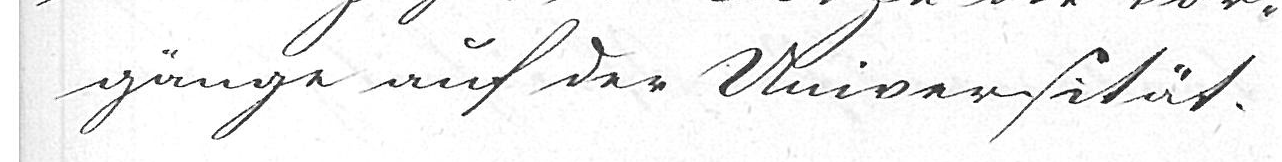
gänge auf der Universität.
